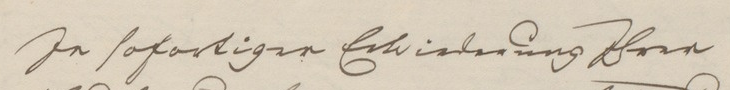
In sofortiger Erwiederung Ihrer
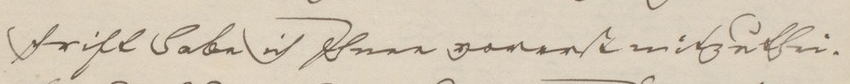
schrift habe ich Ihnen vorerst mitzuthei-
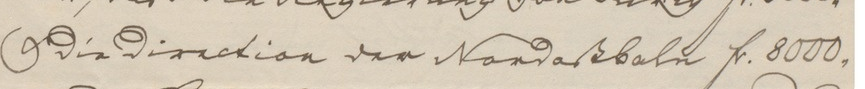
& die Direction der Nordostbahn Fr. 8000–
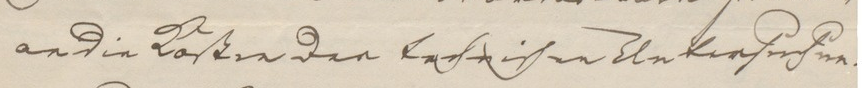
an die Kosten der technischen Untersuchun-
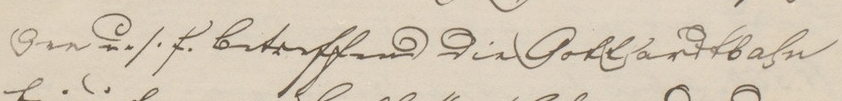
gen u. s. f. betreffend die Gotthardtbahn
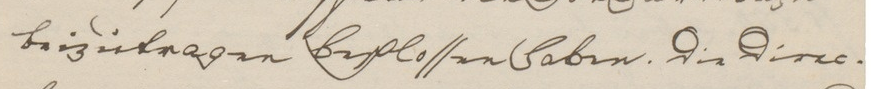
beizutragen beschlossen haben. Die Direc-
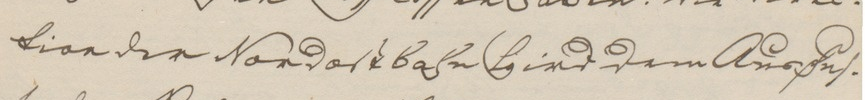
tion der Nordostbahn wird dem Ausschus-
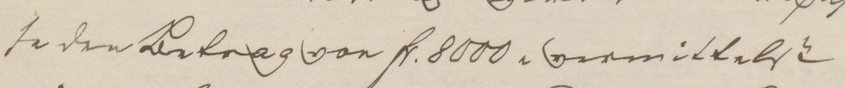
se den Betrag von Fr. 8000– vermittelst
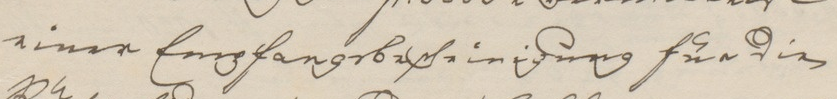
einer Empfangsbescheinigung für die
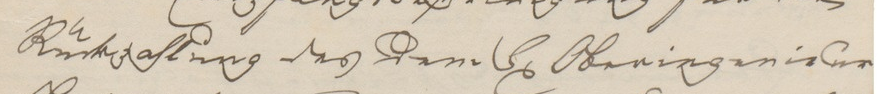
Rückzahlung des dem Hr Oberingenieur
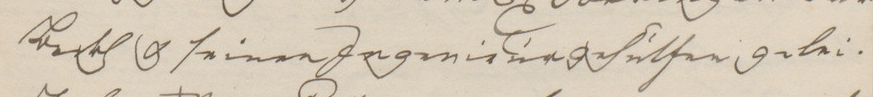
Beckh & seinen Ingenieurgehülfen gelei-
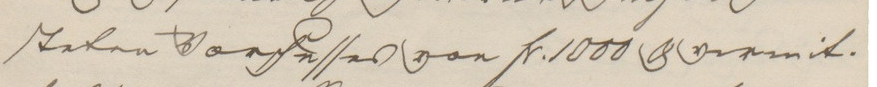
steten Vorschusses von Fr. 1000 & vermit-
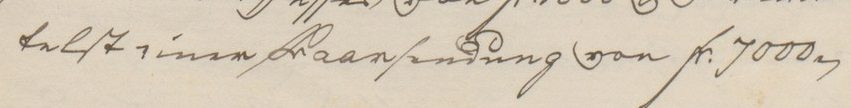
telst einer Baarsendung von Fr. 7000–
